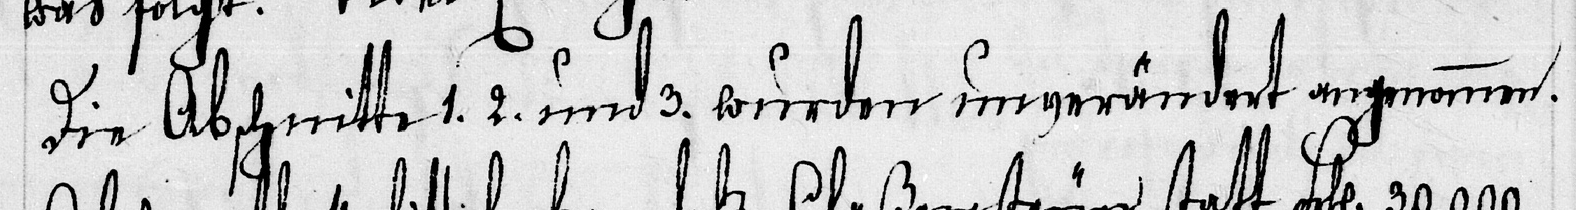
Die Abschnitte 1. 2. und 3. wurden unverändert angenommen.
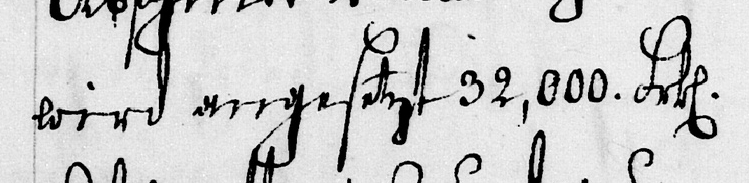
wird angesetzt 32,000. Frk[e¬
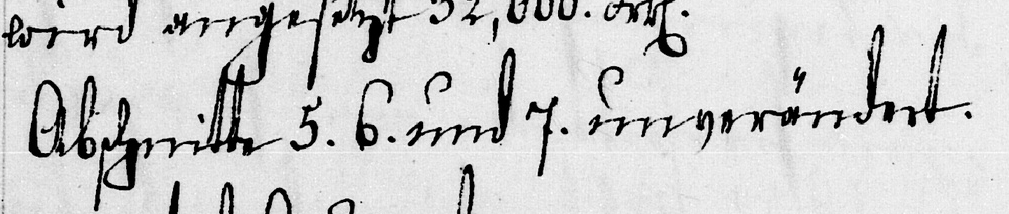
Abschnitte 5. 6. und 7. unverändert.
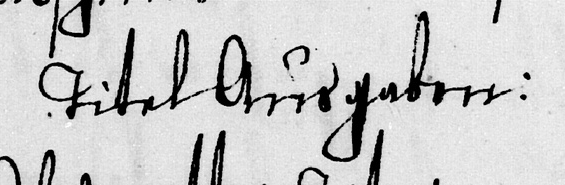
Titel Ausgaben:
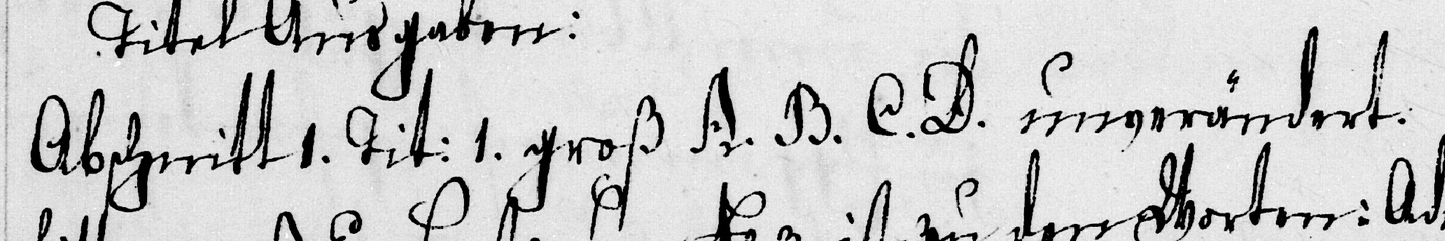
Abschnitt 1. Tit: 1. groß A. B. C. D. unverändert.
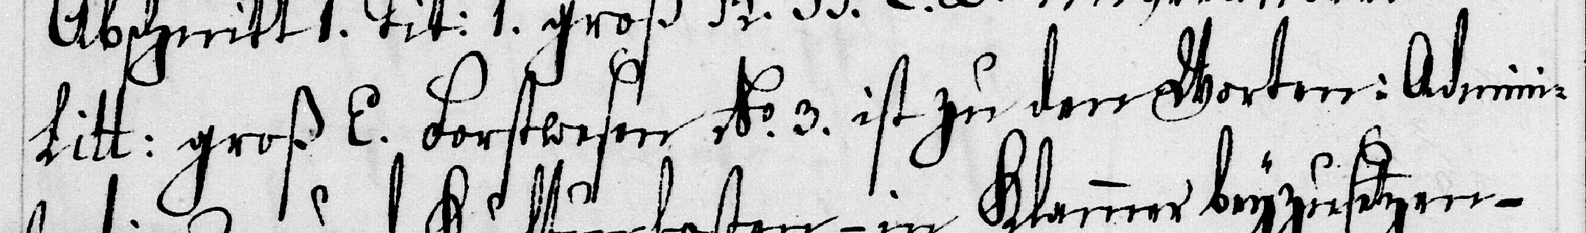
Litt: groß E. Forstwesen No. 3. ist zu den Worten: Admini¬
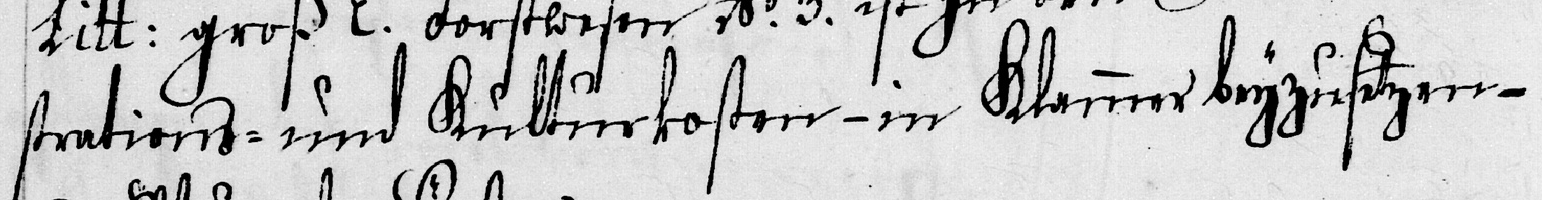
strations- und Kulturkosten – in Klammer beyzusetzen –
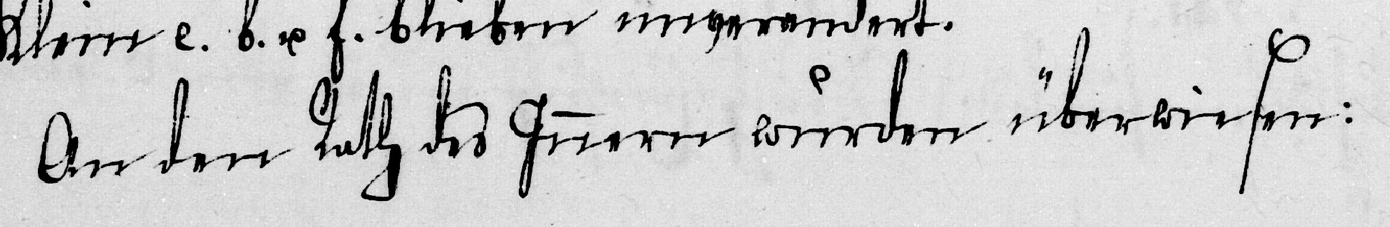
An den Rath des Innern wurden überwiesen:
